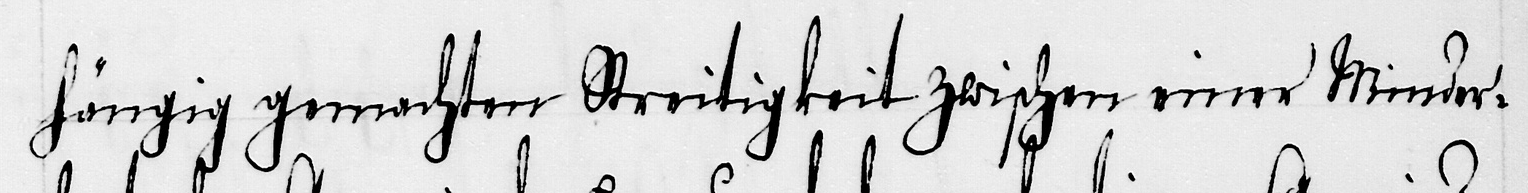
hängig gemachten Streitigkeit zwischen einer Minder¬
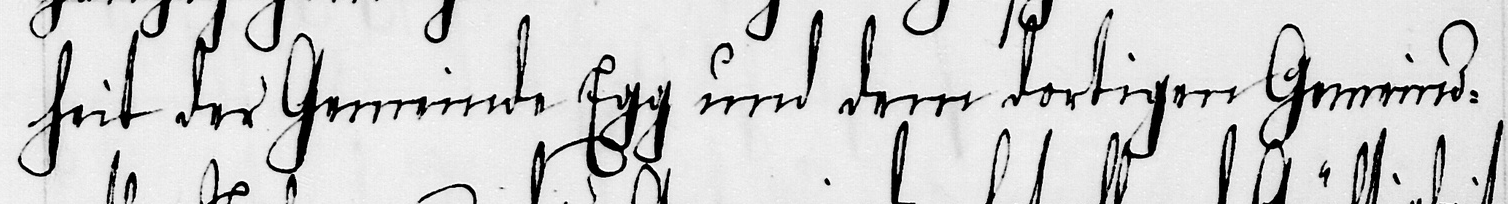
heit der Gemeinde Egg und dem dortigen Gemeind¬
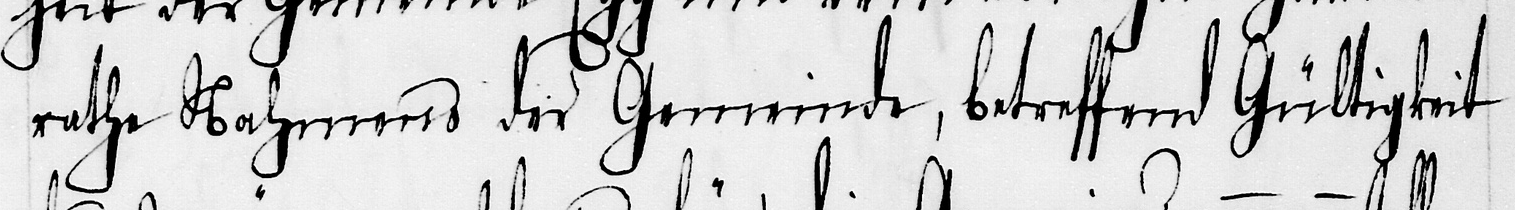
rathe Nahmens der Gemeinde, betreffend Gültigkeit
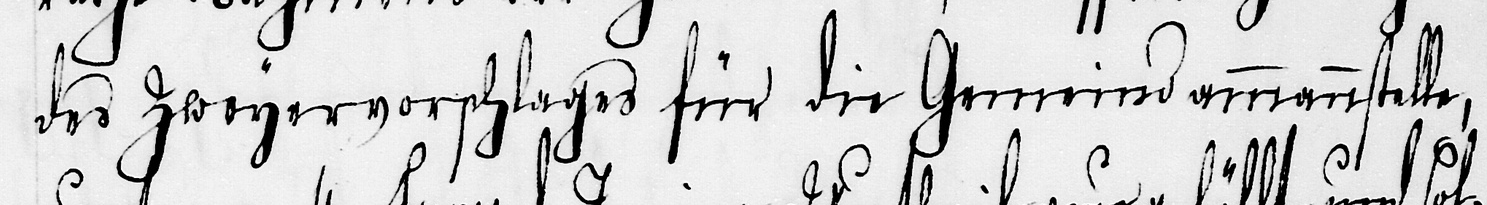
des Zweyervorschlages für die Gemeindammannstell¬
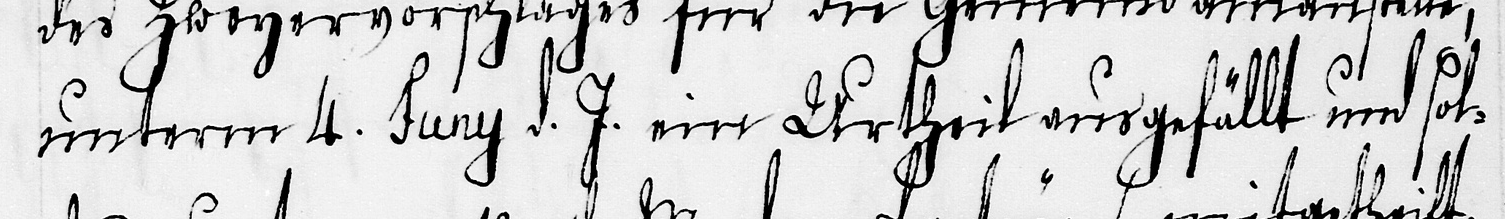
unterm 4. Juny d. J. ein Urtheil ausgefällt und sol¬
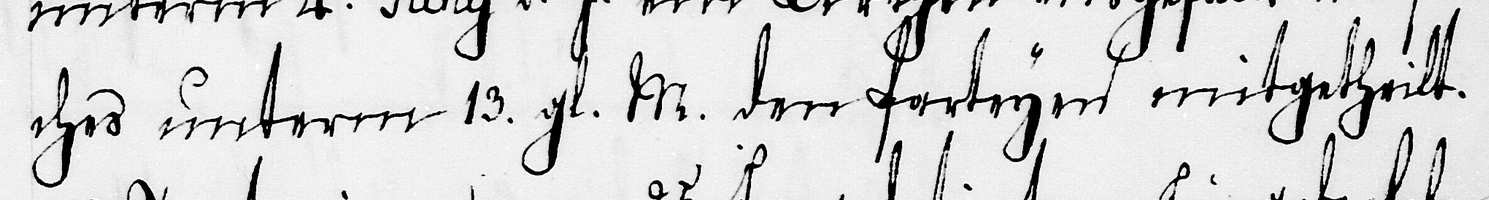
ches unterm 13. gl. M. den Parteyen mitgetheilt.
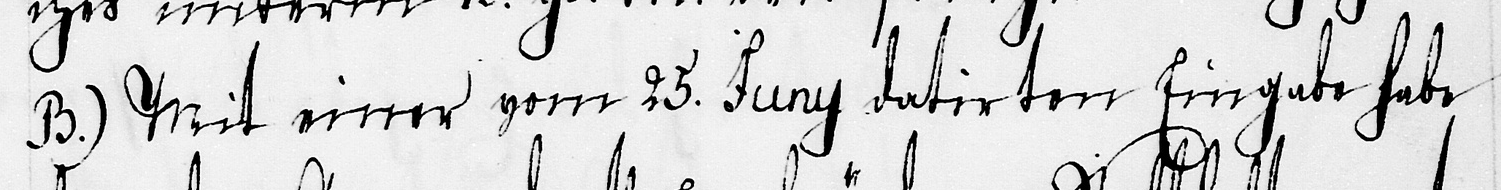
B.) Mit einer vom 25. Juny datirten Eingabe habe
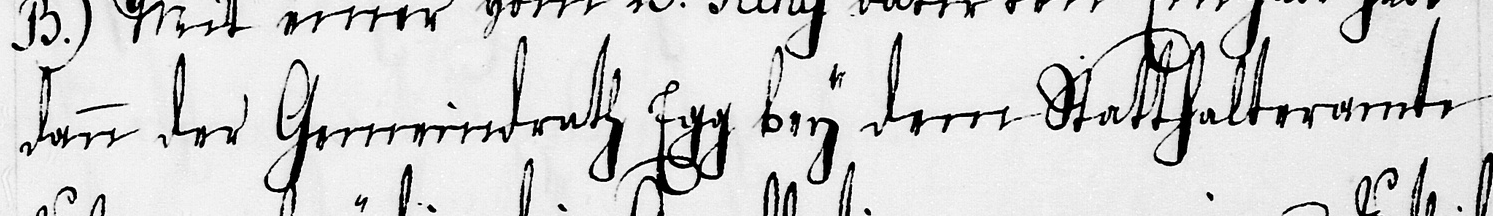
dann der Gemeindrath Egg bey dem Statthalteramte
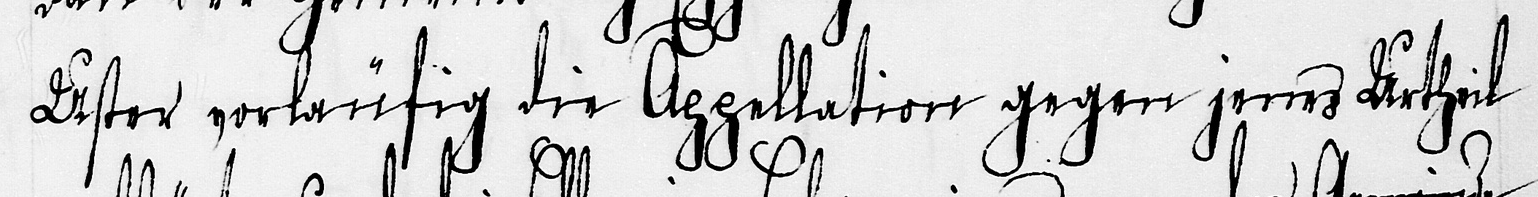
Uster vorläufig die Appellation gegen jenes Urtheil
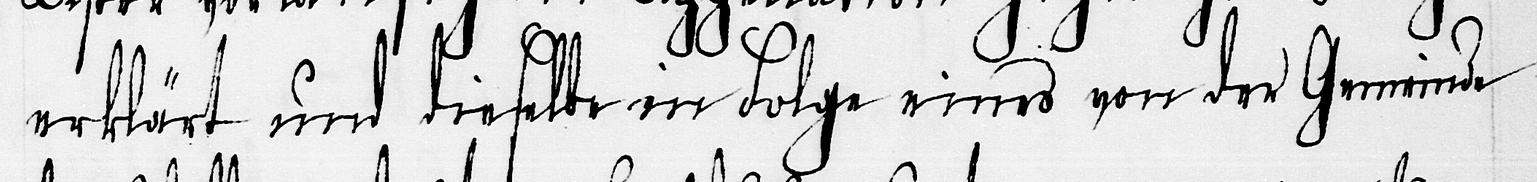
erklärt und dieselbe in Folge eines von der Gemeinde
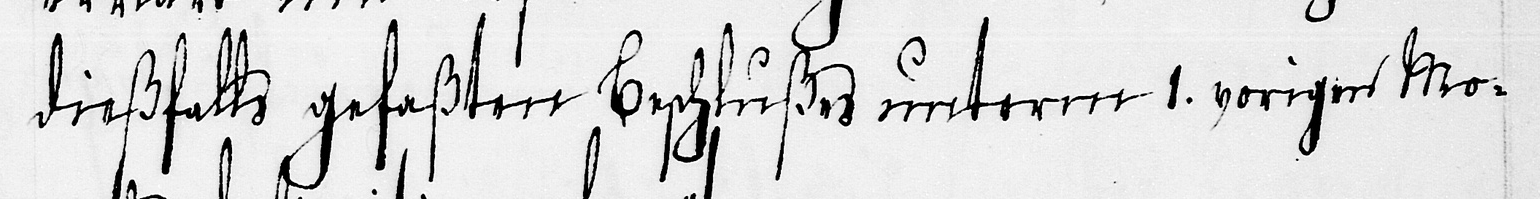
dießfalls gefaßten Beschlußes unterm 1. vorigen Mo¬
